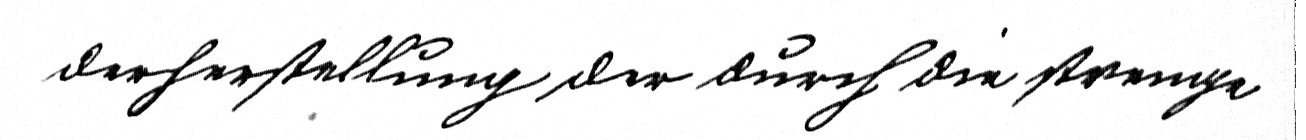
derherstellung der durch die strenge
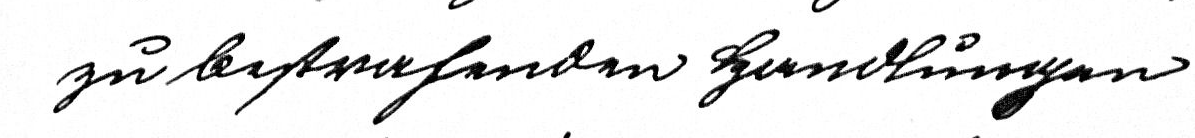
zu bestrafenden Handlungen
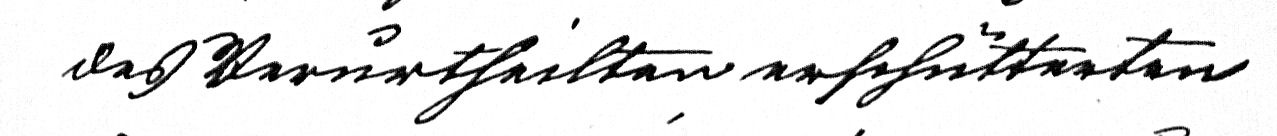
des Verurtheilten erschütterten
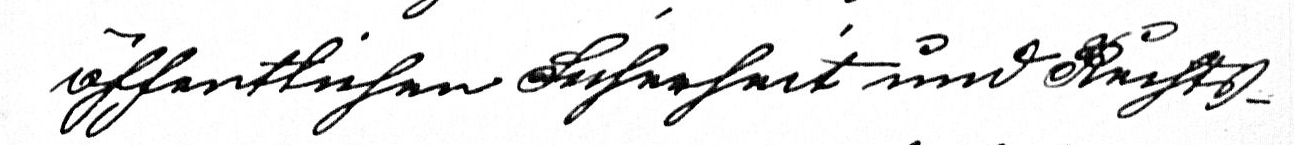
öffentlichen Sicherheit und Rechts¬
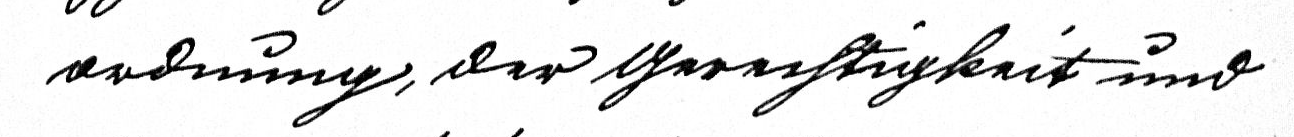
ordnung, der Gerechtigkeit und
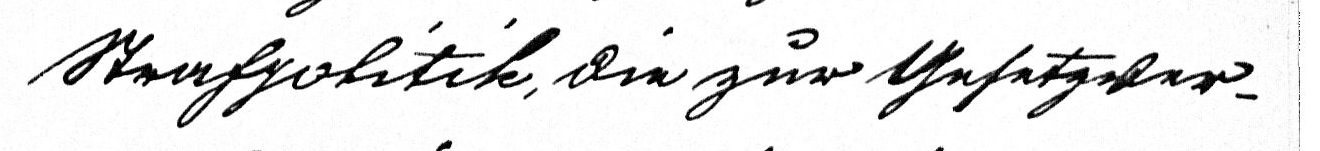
Strafpolitik, die zur Gesetzver¬
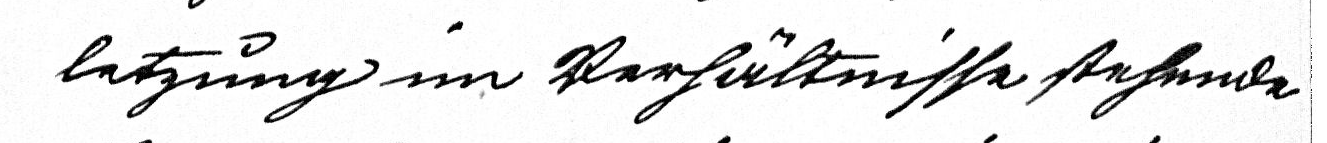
letzung im Verhältnisse stehende
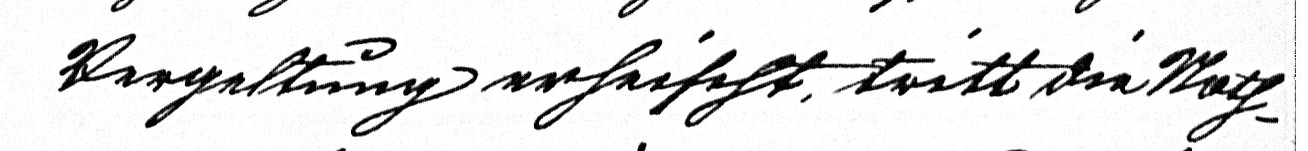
Vergeltung erheischt, tritt die Noth¬
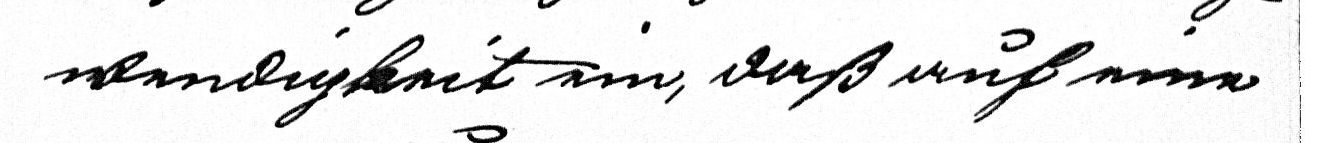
wendigkeit ein, daß auf eine
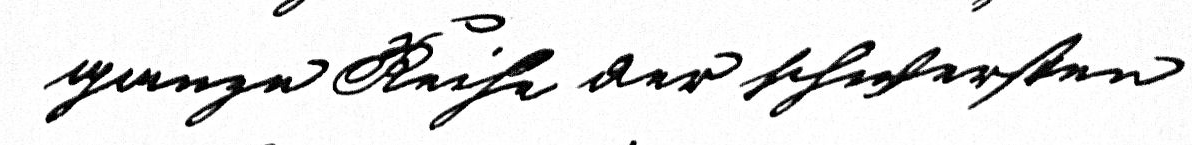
ganze Reihe der schwersten
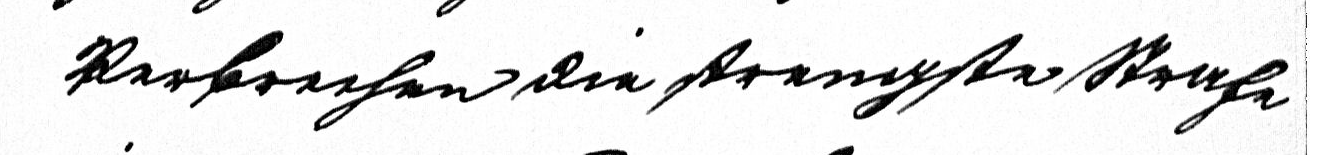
Verbrechen die strengste Strafe
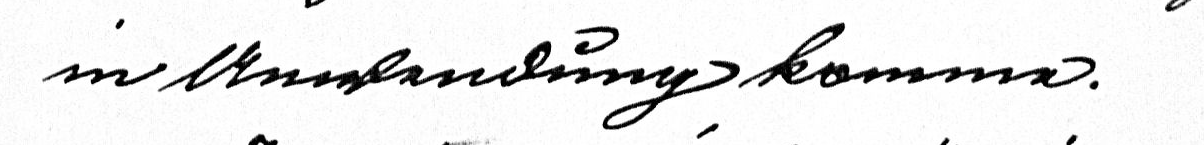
in Anwendung komme.
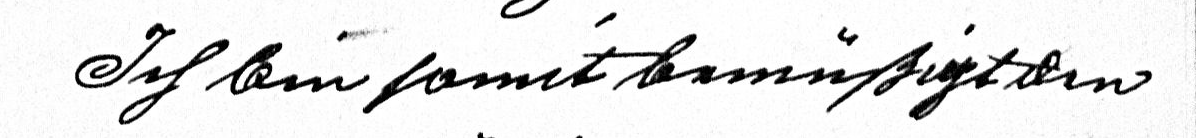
Ich bin somit bemüßigt den
